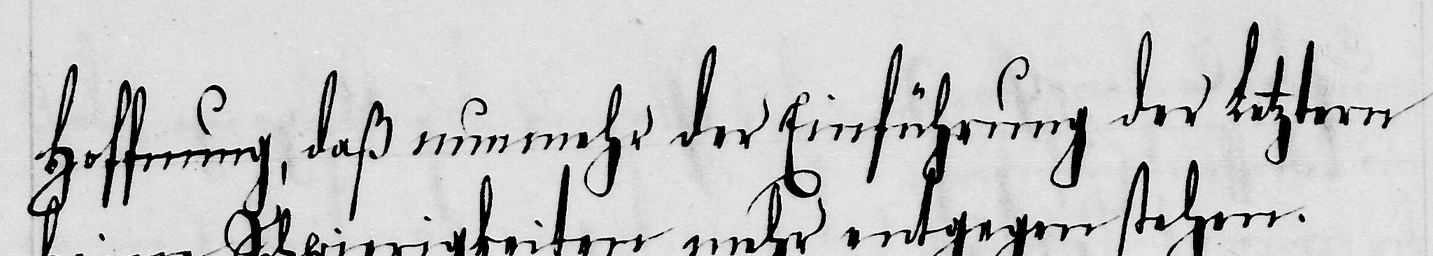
Hoffnung, daß nunmehr der Einführung der Letztern
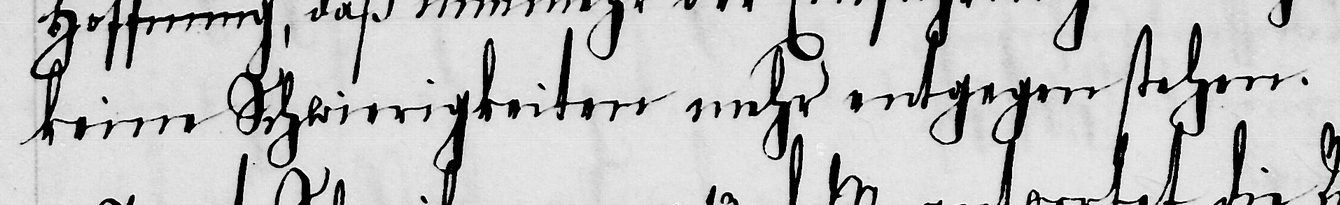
keine Schwierigkeiten mehr entgegen stehen.
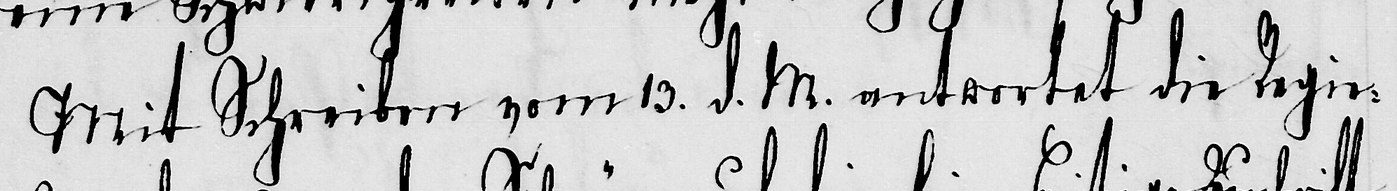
Mit Schreiben vom 13. d. M. antwortet die Regie¬
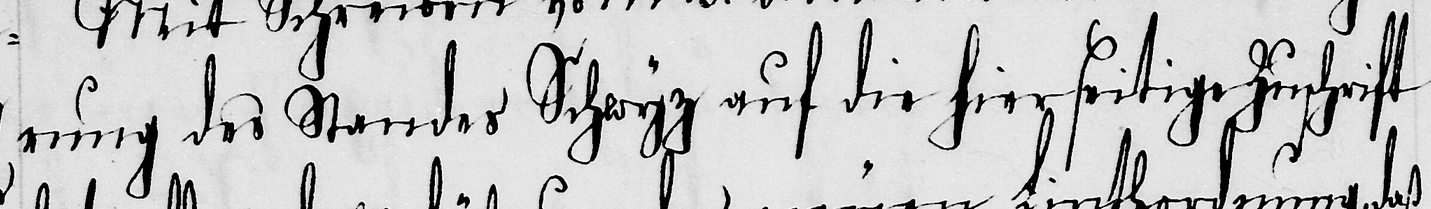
rung des Standes Schwyz auf die hierseitige
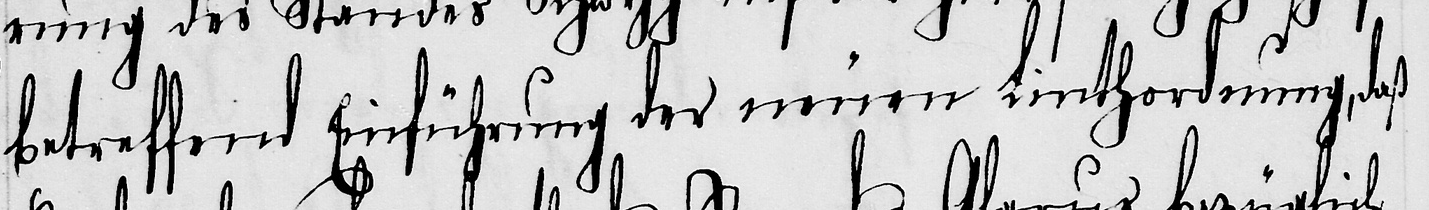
betreffend Einführung der neuen Linthordnung, daß
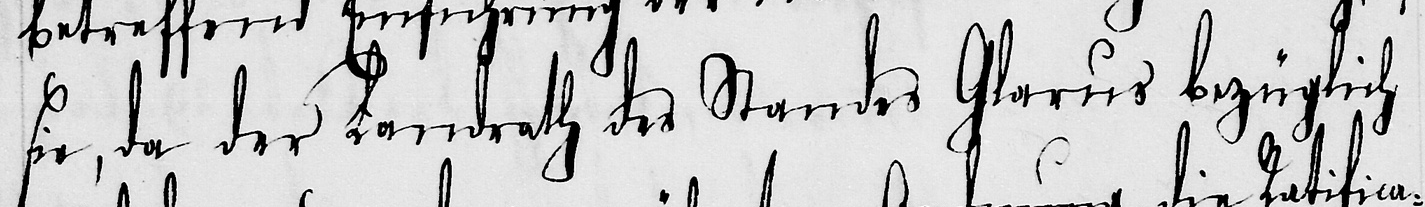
sie, da der Landrath des Standes Glarus bezüglich
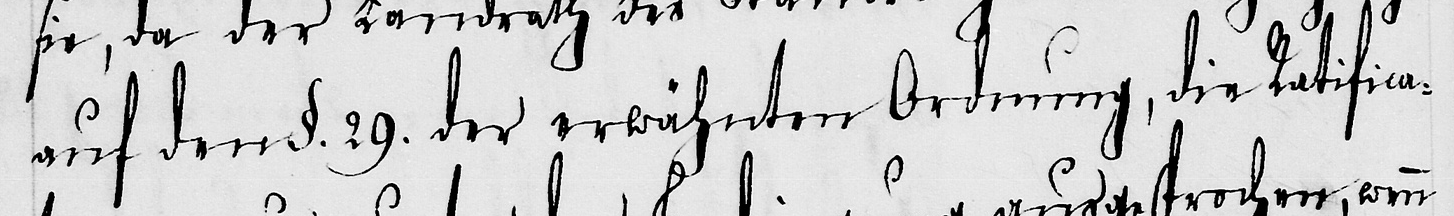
auf den §. 29. der erwähnten Ordnung, die Ratifica¬
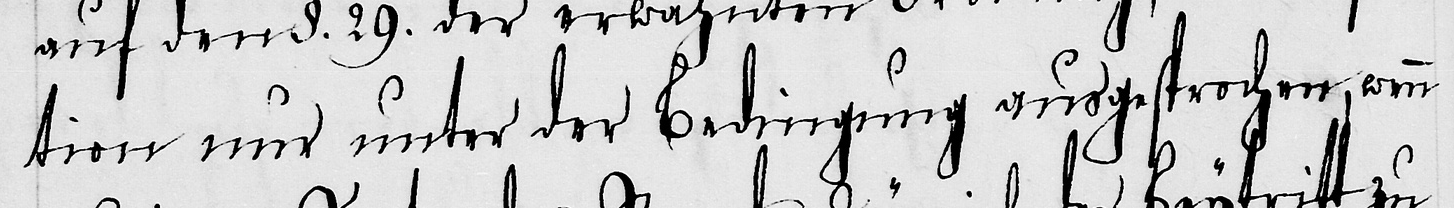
tion nur unter der Bedingung ausgesprochen, wenn
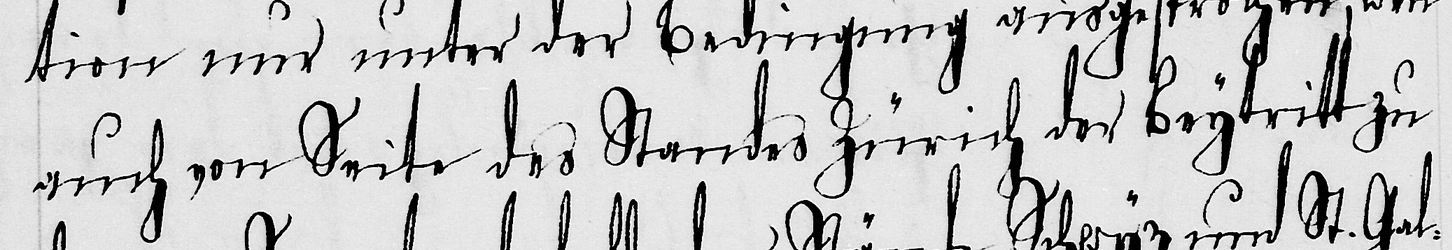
auch von Seite des Standes Zürich der Beytritt zu
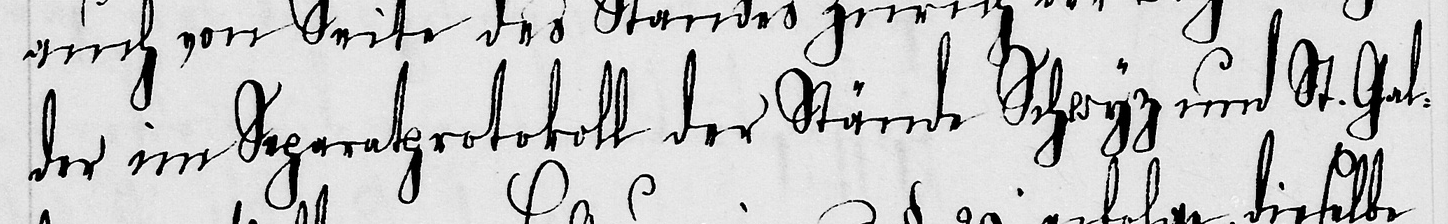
der im Separatprotokoll der Stände Schwyz und St. Ga¬
